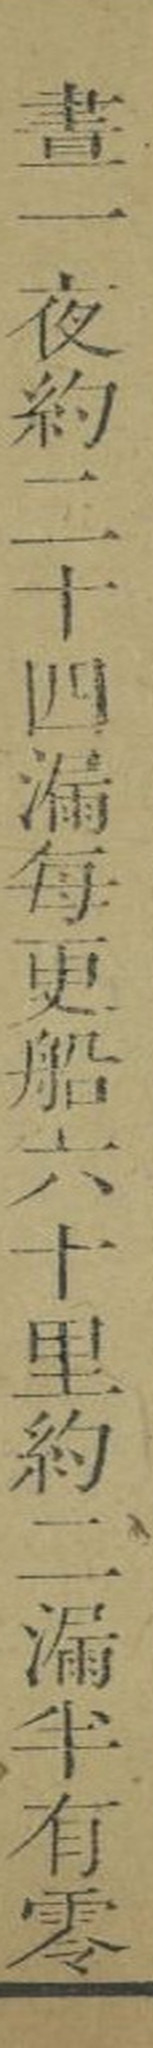晝一夜約二十四漏每更船六十里約二漏半有零
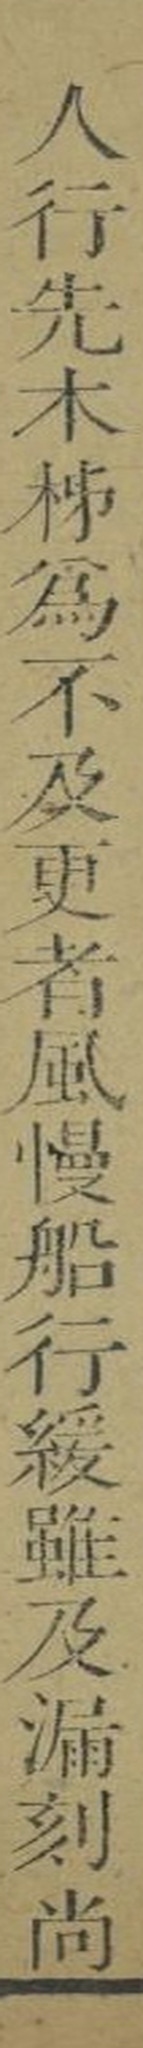人行先木柹爲不及更者風慢船行緩雖及漏刻尚
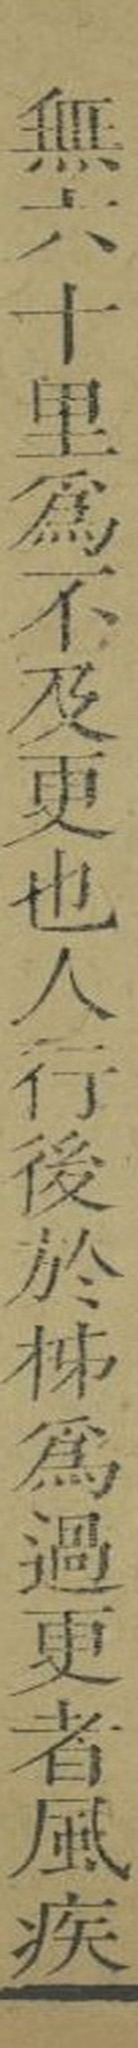無六十里爲不及更也人行後於柹爲過更者風疾

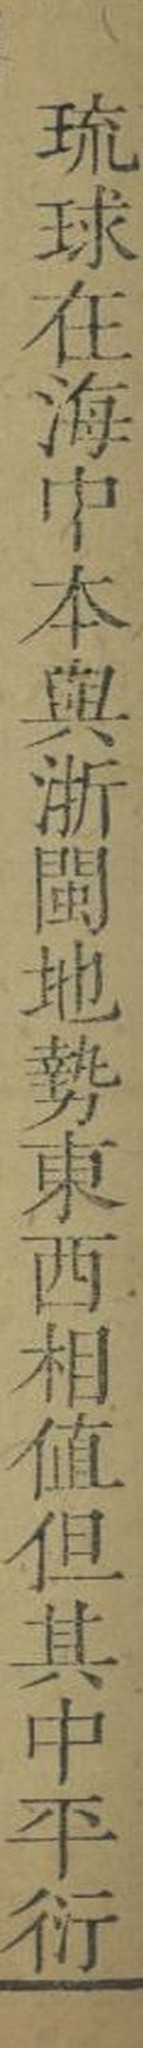琉球在海中本與浙閩地勢東西相値但其中平衍
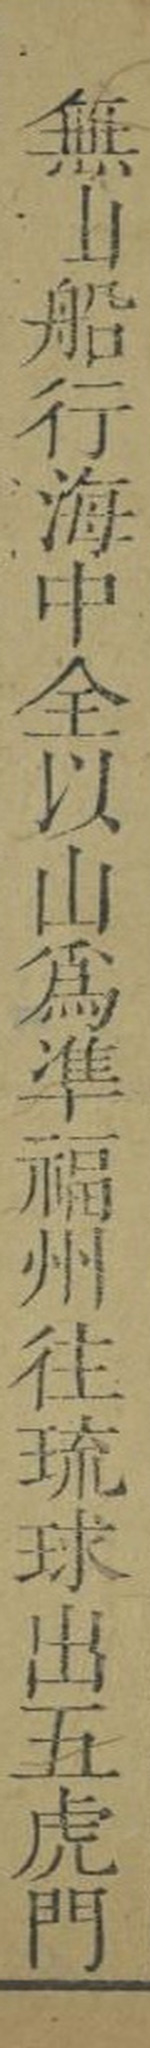無山船行海中全以山爲凖福州往琉球出五虎門
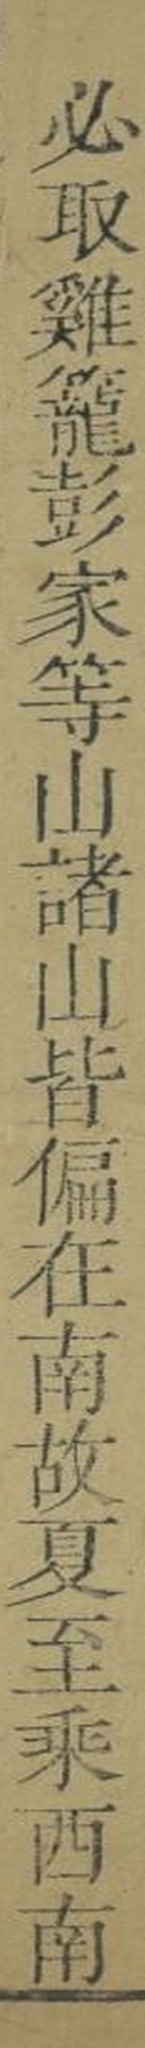必取雞籠彭家等山諸山皆偏在南故夏至乘西南
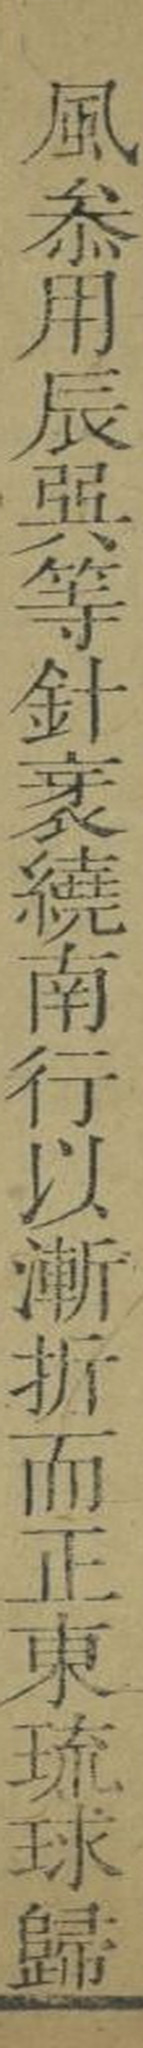風叅用辰巽等針袤繞南行以漸折而正東琉球歸
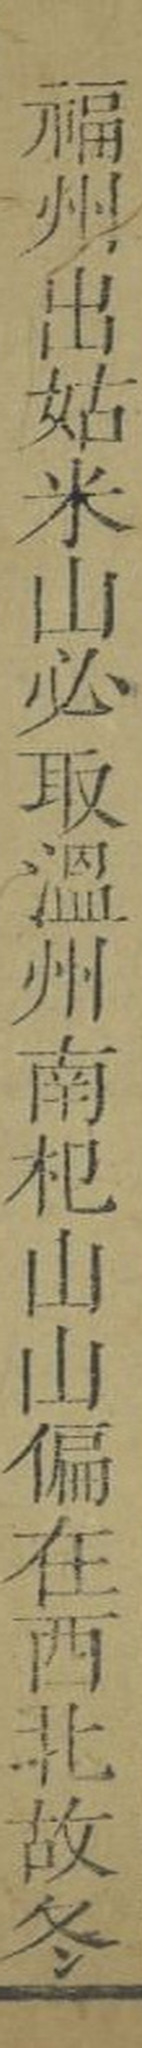福州出姑米山必取溫州南杞山山偏在西北故冬
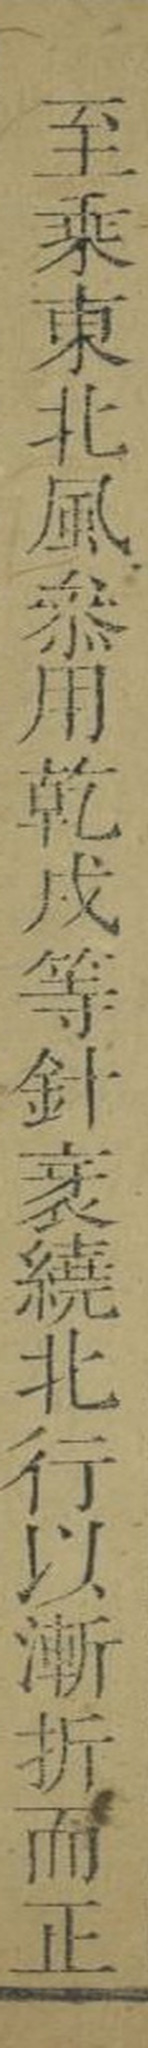至乘東北風叅用乾戌等針袤繞北行以漸折而正
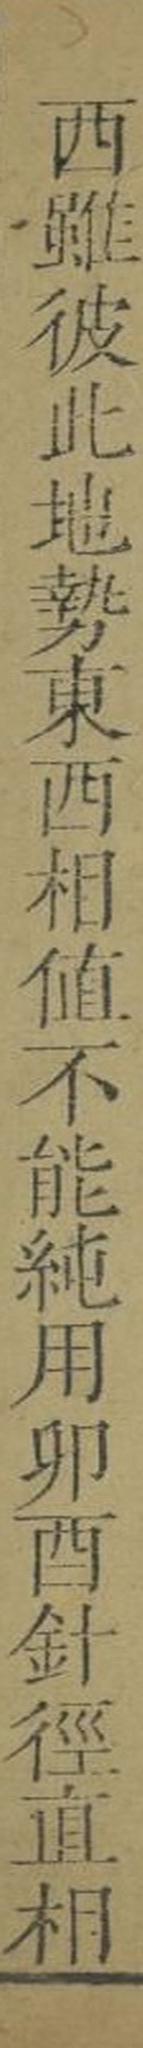西雖彼此地勢東西相値不能純用卯酉針徑直相
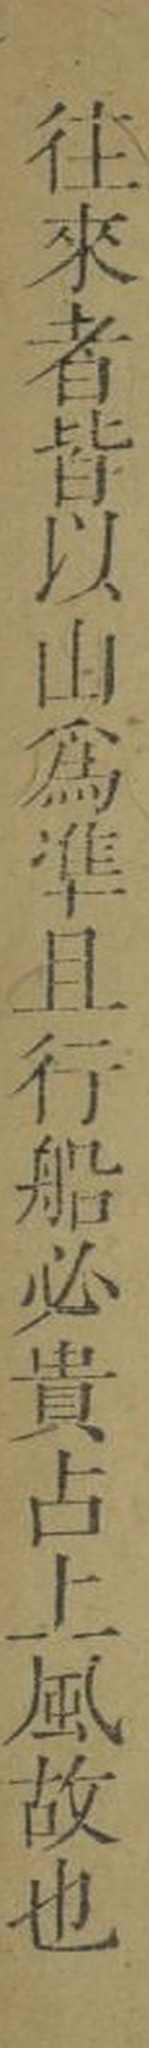往來者皆以山爲凖且行船必貴占上風故也

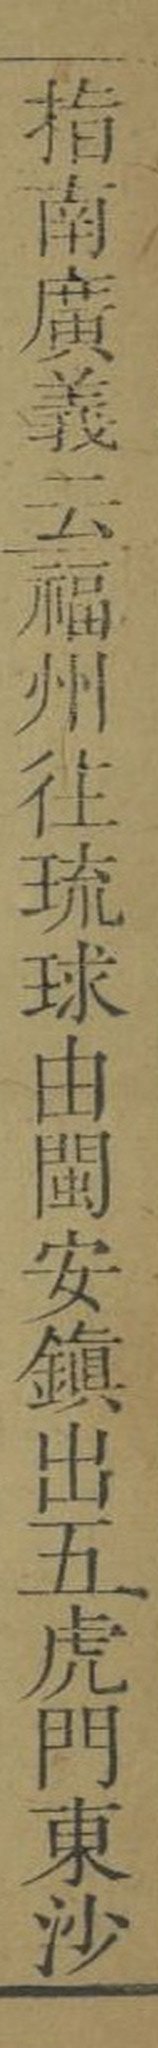[指南廣義云]福州往琉球由閩安鎭出五虎門東沙
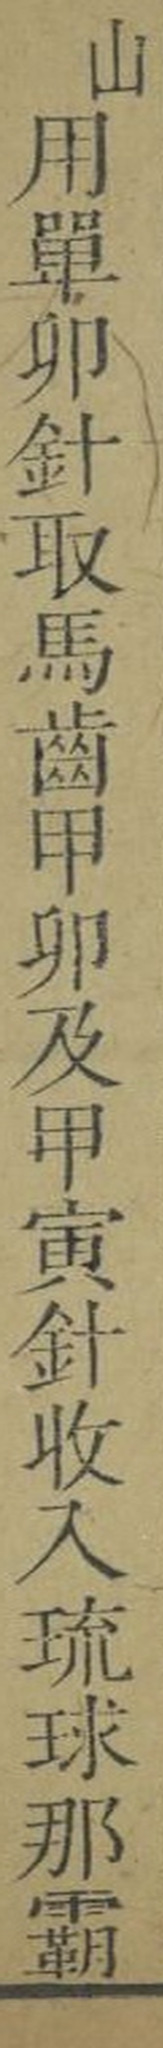山用單卯針取馬齒甲卯及甲寅針收入琉球那霸
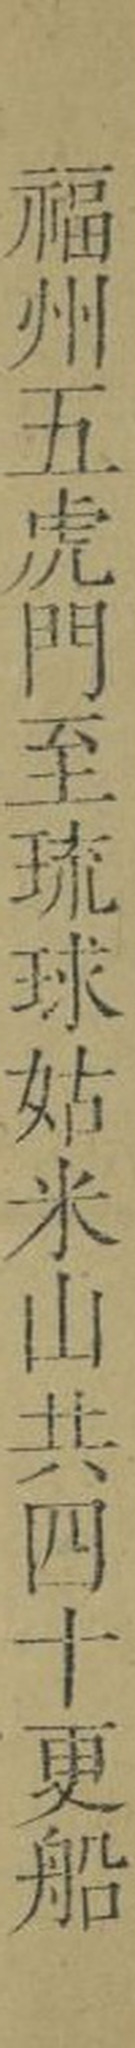福州五虎門至琉球姑米山共四十更船
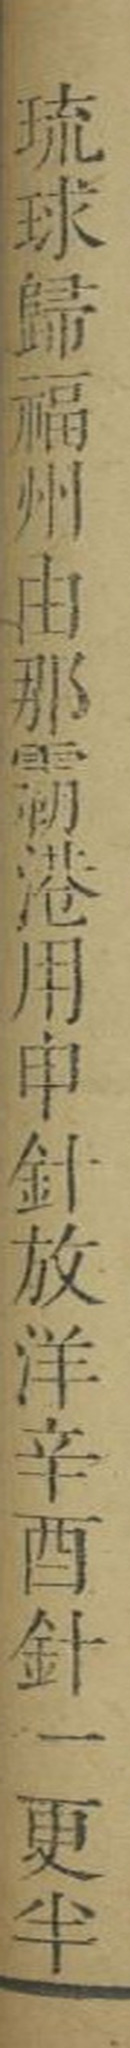琉球歸福州由那霸港用申針放洋辛酉針一更半
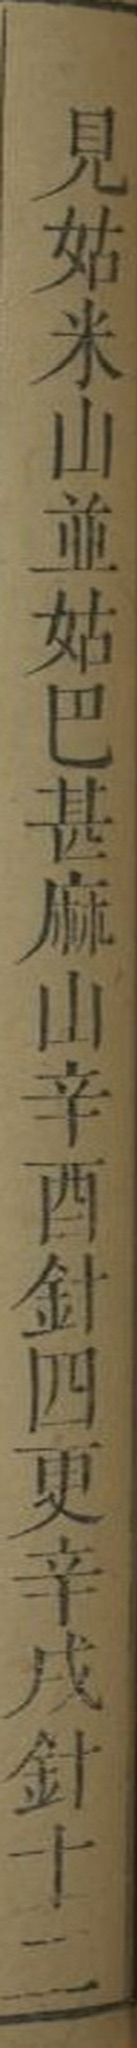見姑米山並姑巴甚麻山辛酉針四更辛戌針十二
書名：中山伝信録 巻一
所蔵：University of the Ryukyus Library
